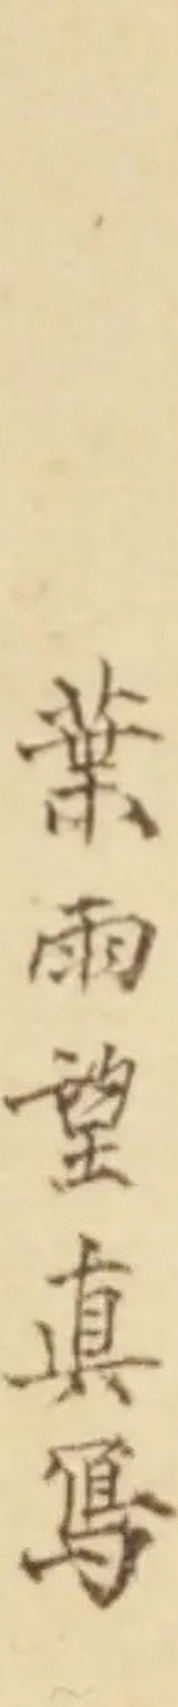葉雨望真写
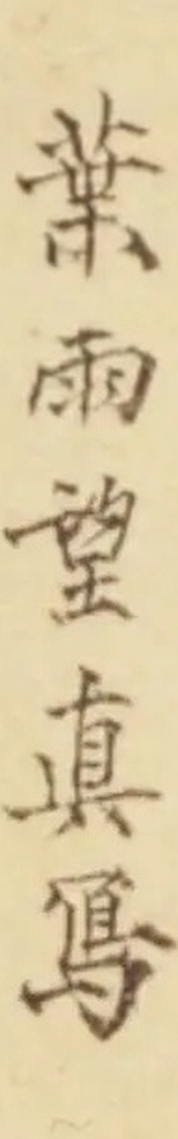葉雨望真写
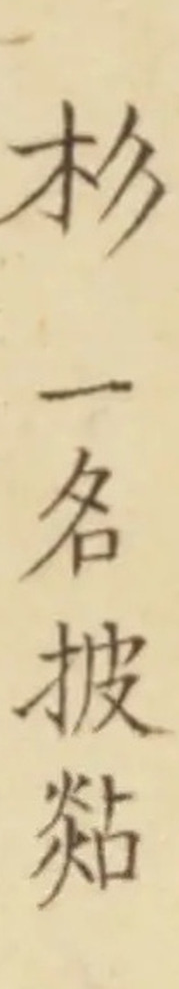杉一名披煔
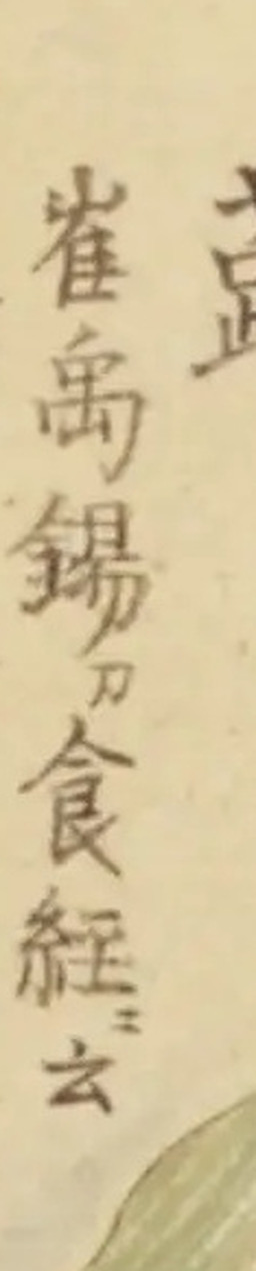崔禹鍚カ食経ニ云
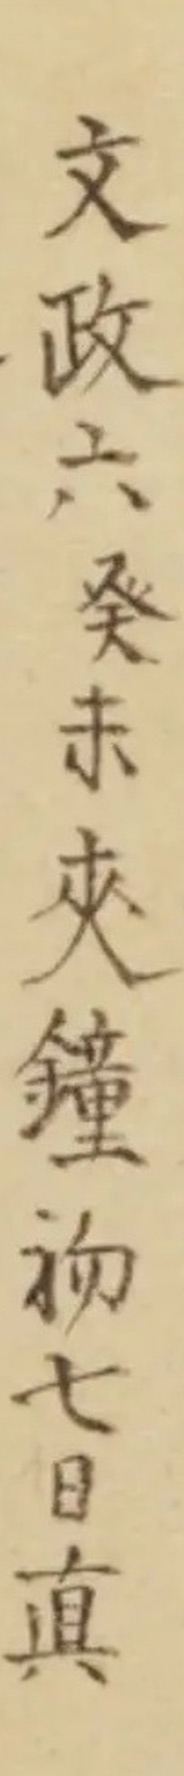文政六年癸未夾鐘初七日真
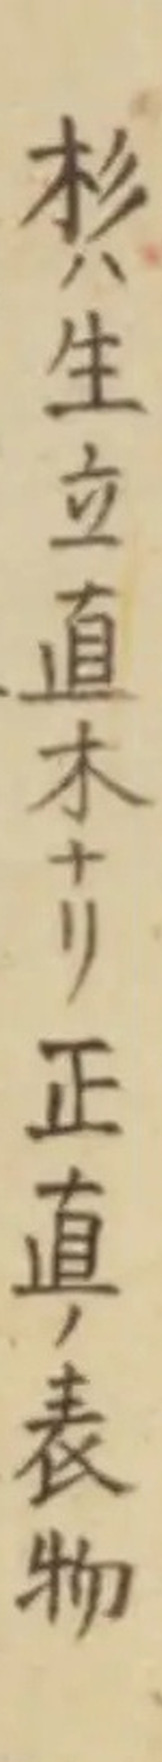杉ハ生立直木ナリ正直ノ表物
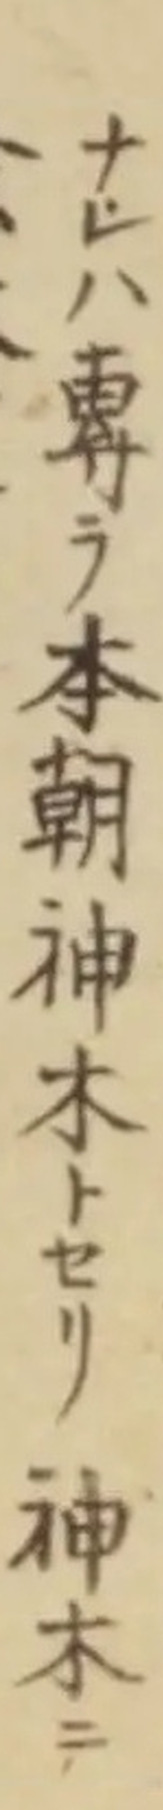ナレハ専ラ本朝神木トセリ神木ニ
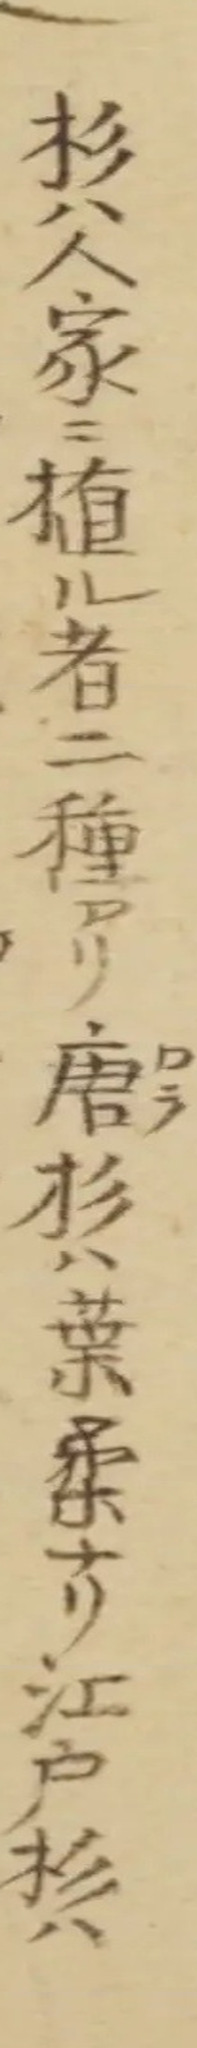杉ハ人家ニ植ル者二種アリ唐杉ハ葉柔ナリ江戸杉ハ
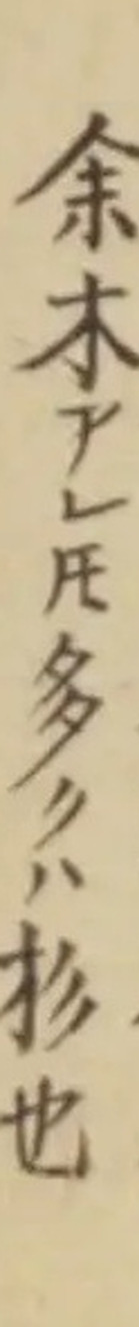余木アレトモ多クハ杉也
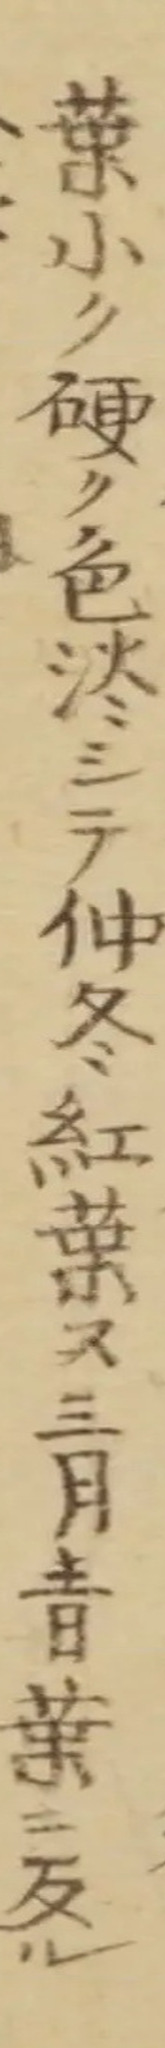葉小ク硬ク色淡シテ仲冬紅葉ス三月青葉ニシタル
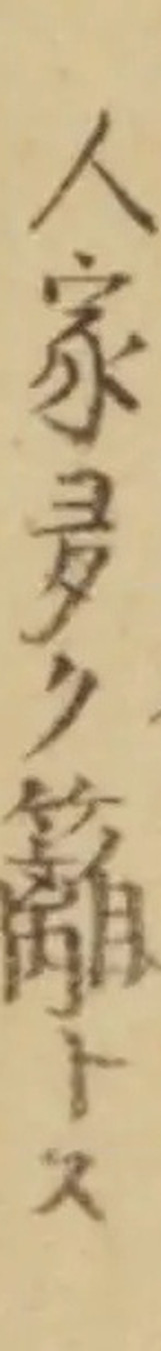人家多ク籬トス

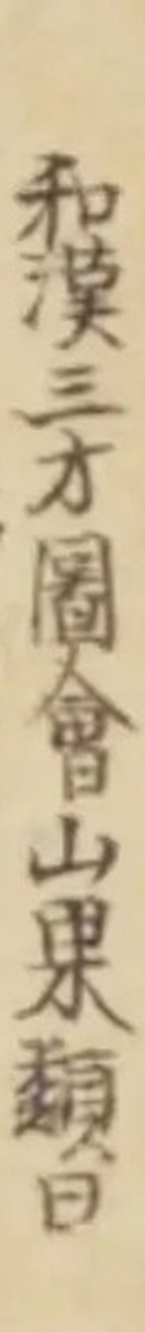和漢三才図会山果類曰
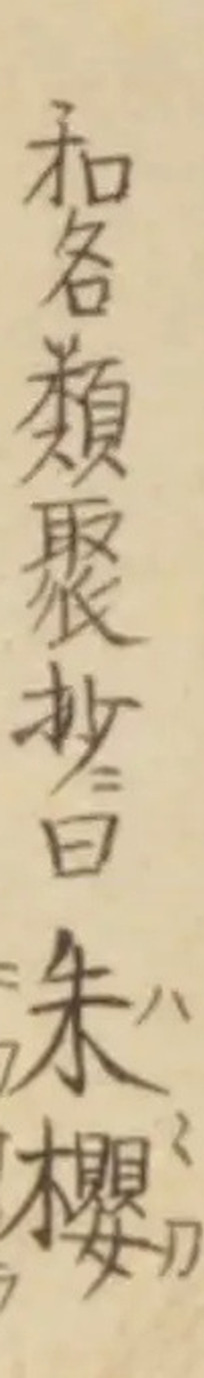和名類聚抄曰朱桜
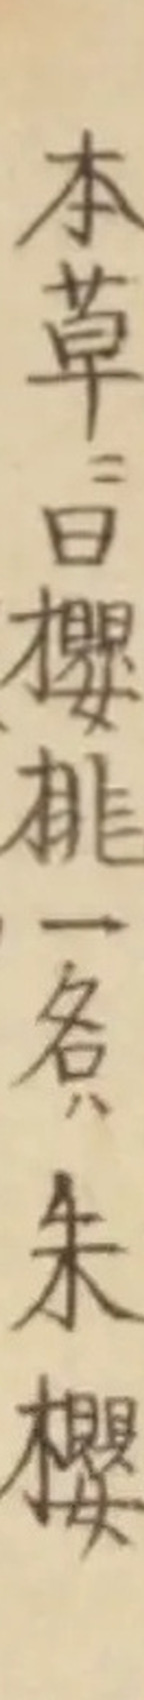本草曰桜棑一名朱桜
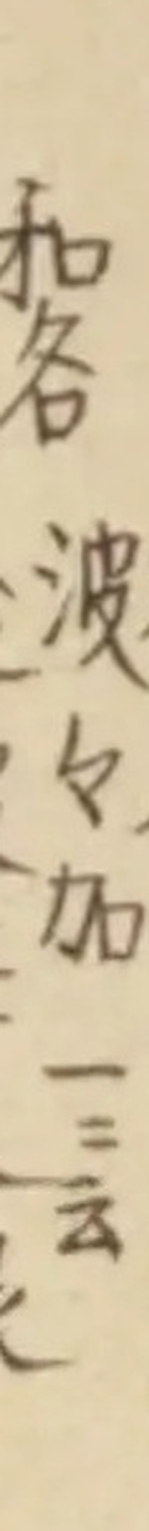和名波々加一云
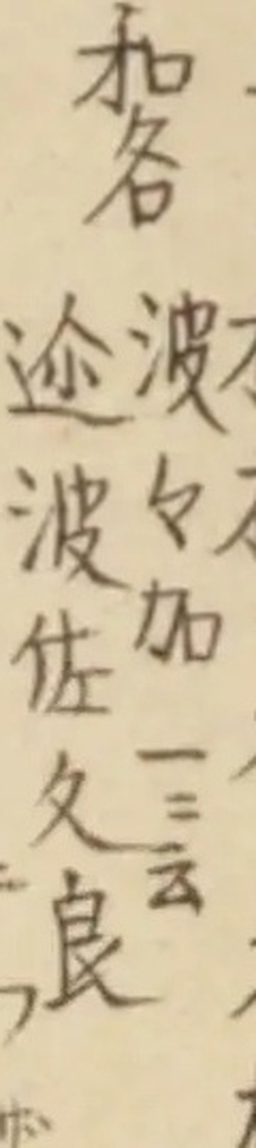迩波佐久良
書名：梅園草木花譜春之部. 1
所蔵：国立国会図書館 National Diet Library, JAPAN
